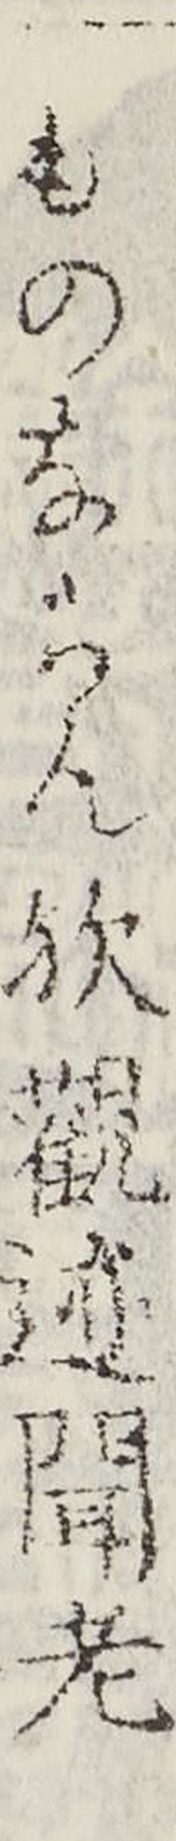ものならん歟観迹聞老
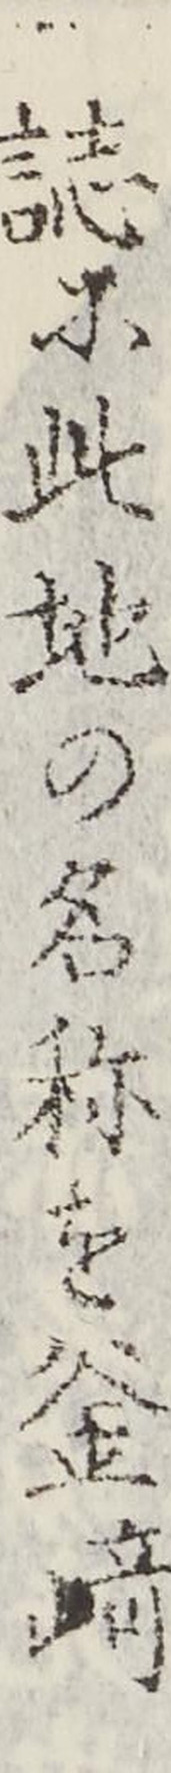誌に此地の名称を釜崎
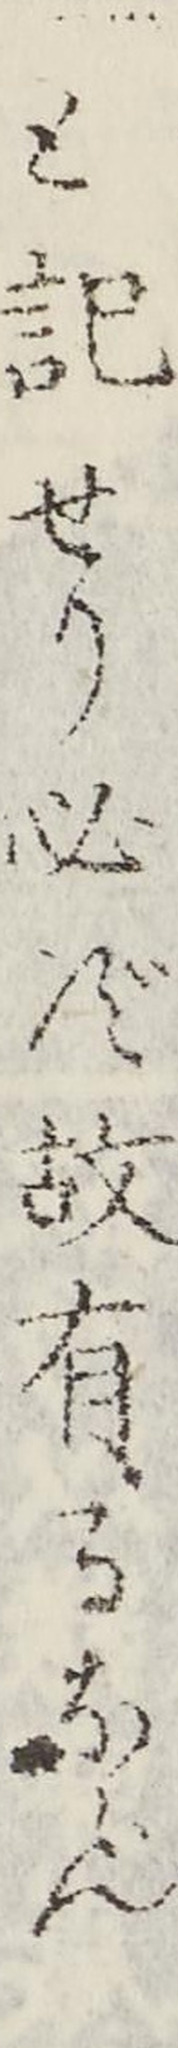と記せり必ず故有るならん
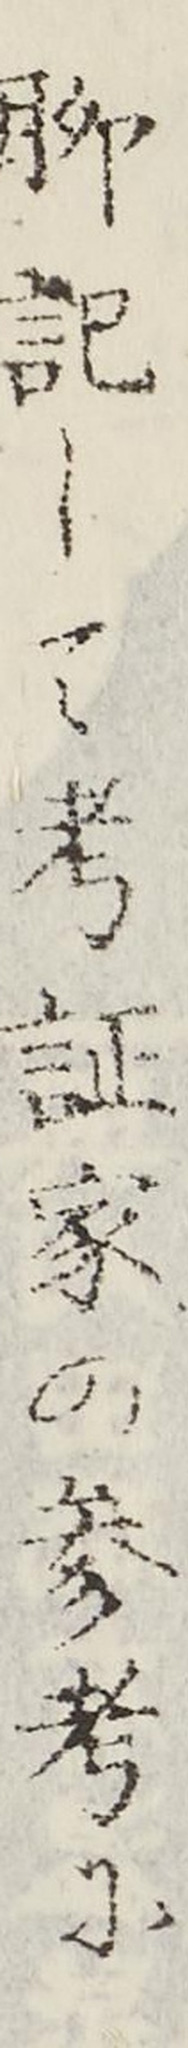聊記して考証家の参考に
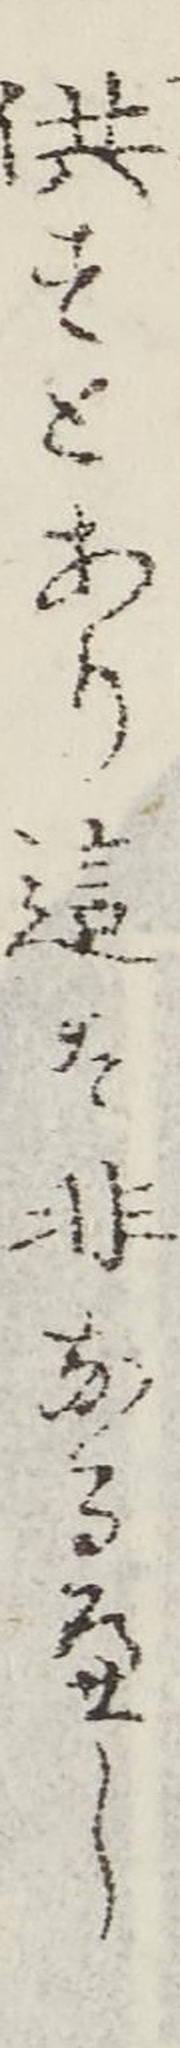供すとあり這は非なるへし
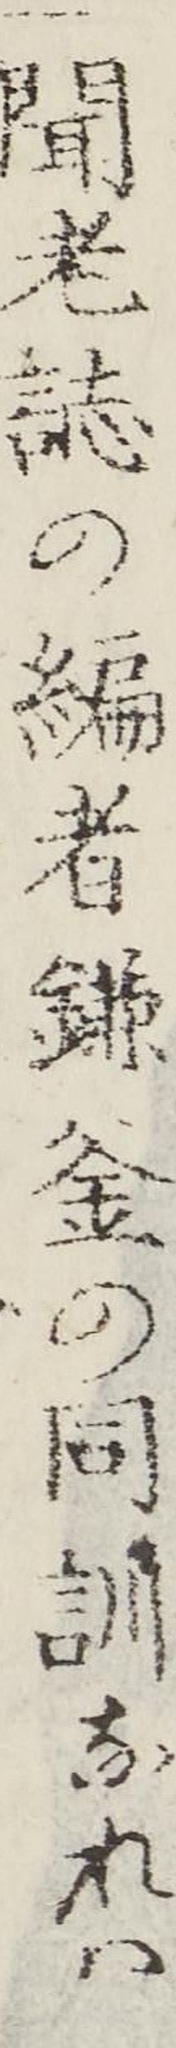聞老誌の編者鎌釜の同訓なれハ
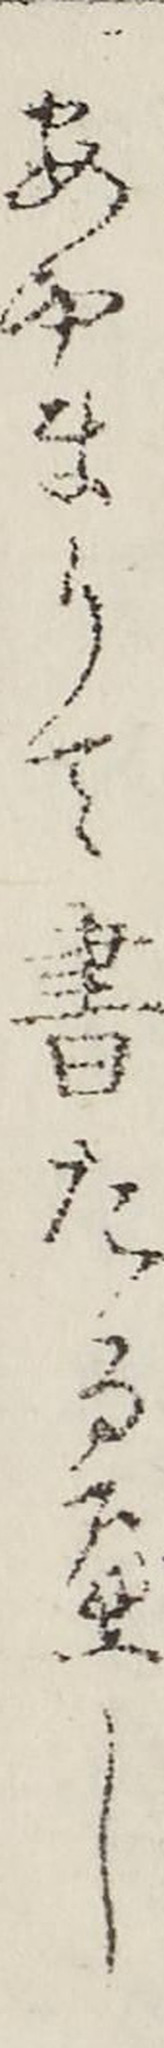あやまりて書たるべし

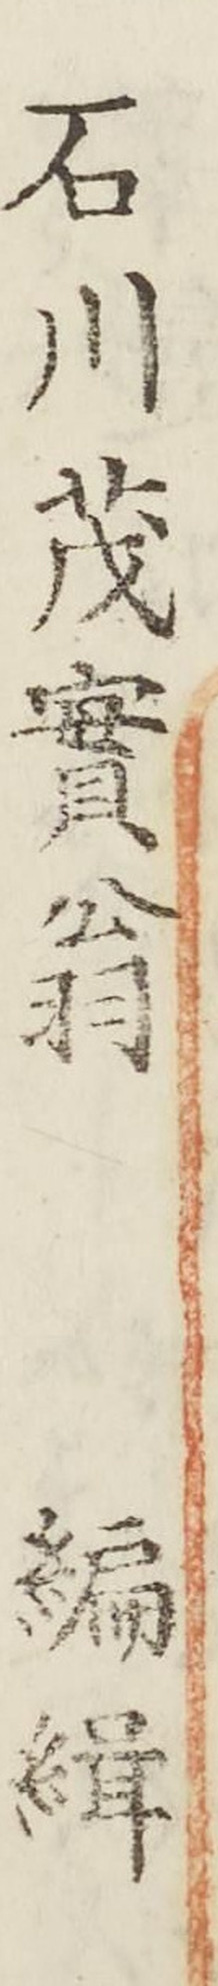石川茂実翁編緝
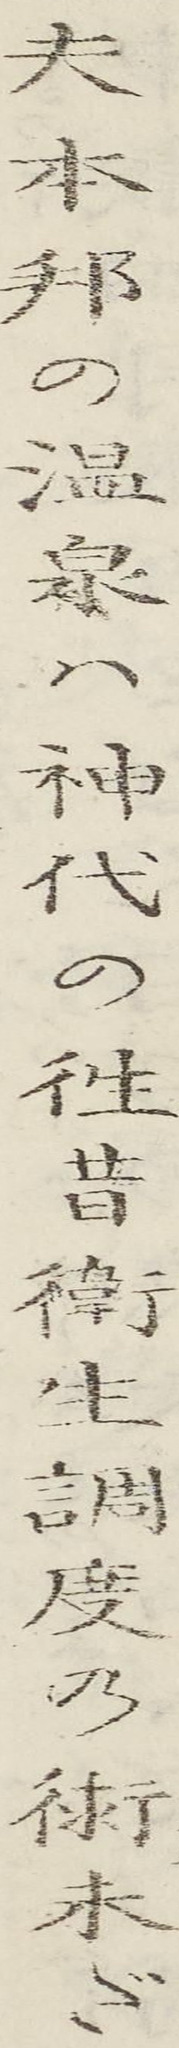夫本邦の温泉は神代の往昔衛生調度の術未だ
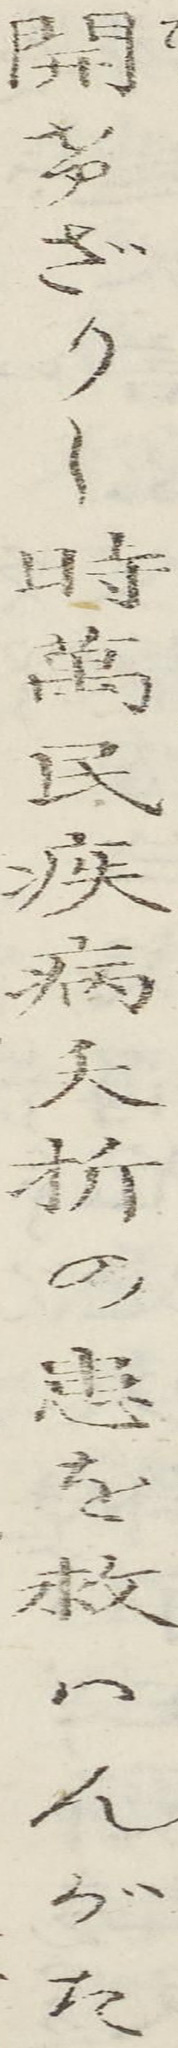開けざりし時万民疾病夭折の患を救はんがた
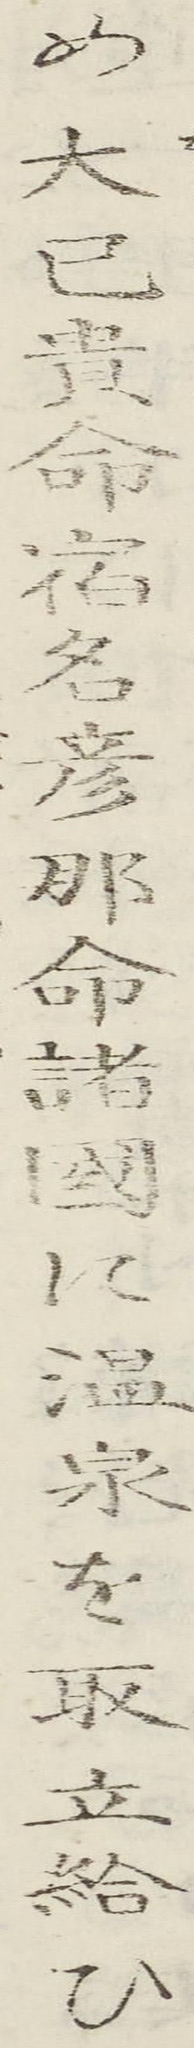め大已貴命宿名彦那命諸国に温泉を取立給ひ
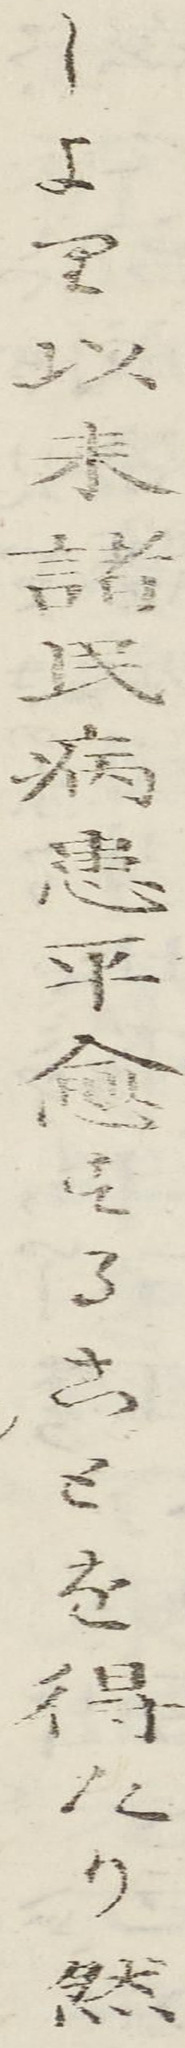しより以来諸民病患平愈することを得たり然
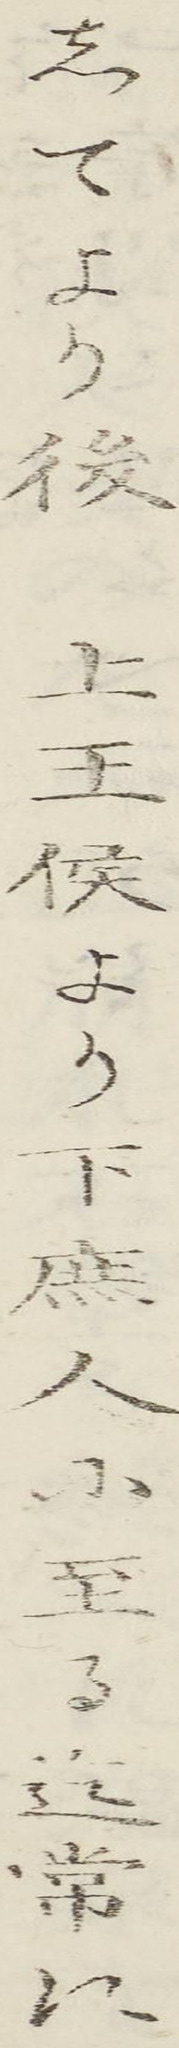してより後上王侯より下庶人に至る迄常に
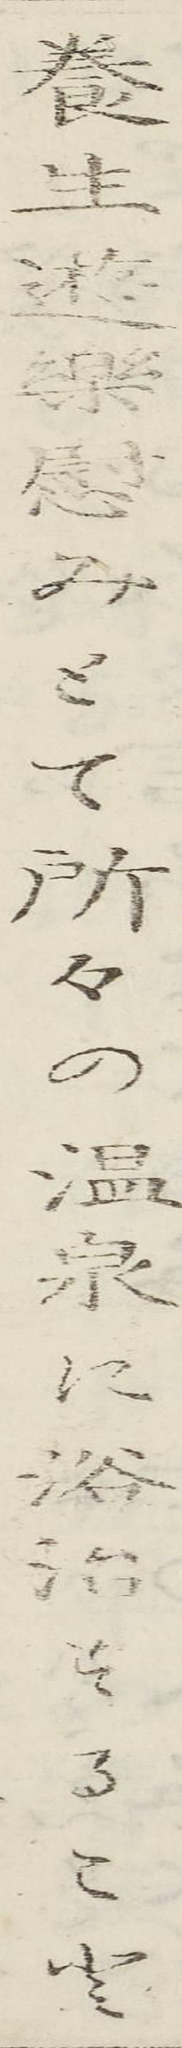養生遊楽慰みとて所々の温泉に浴治すること
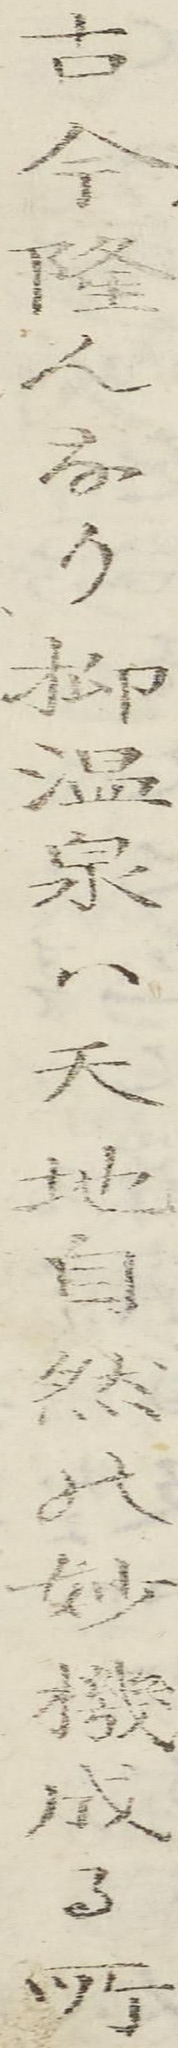古今隆んなり抑温泉は天地自然の妙機成る所
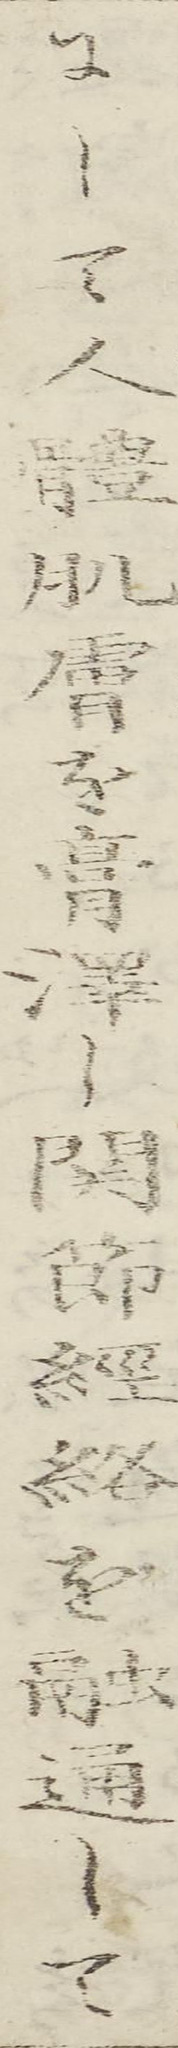にして人体肌膚を膏沢し関節経絡を融通して
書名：鎌先温泉由來記
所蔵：東京大学地震研究所図書室 Earthquake Research Institute Library, The University of Tokyo, JAPAN
